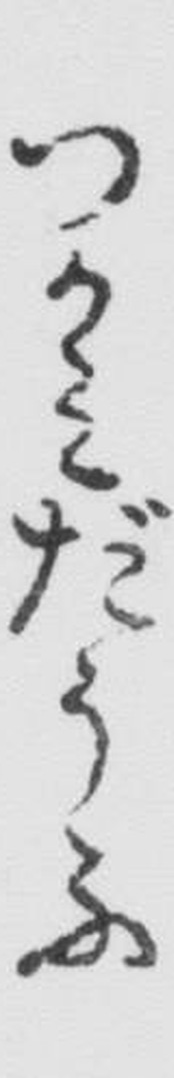つかみだうふ
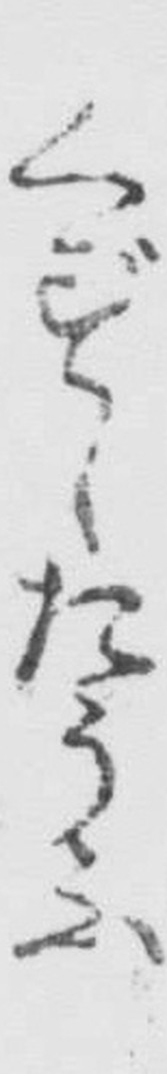くずしたうふ
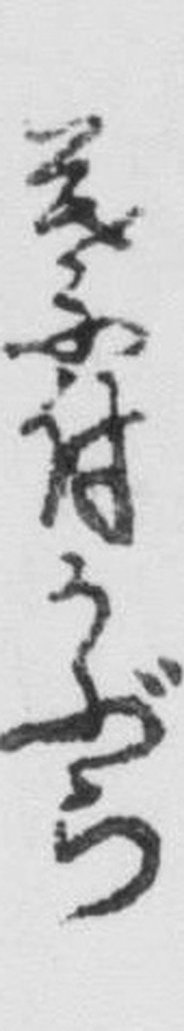葉付かぶら
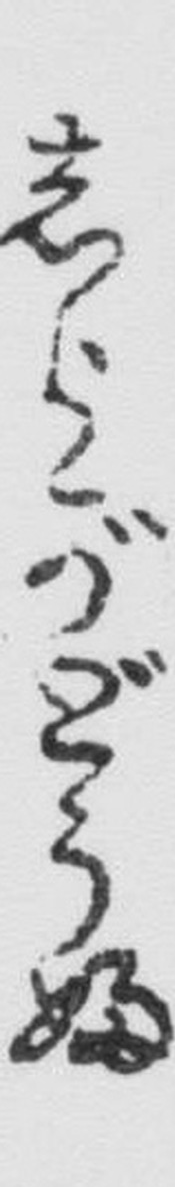しらがどうふ
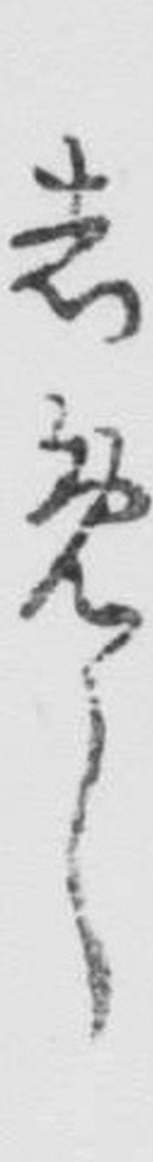しめし
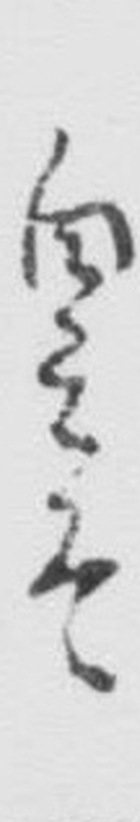白みそ
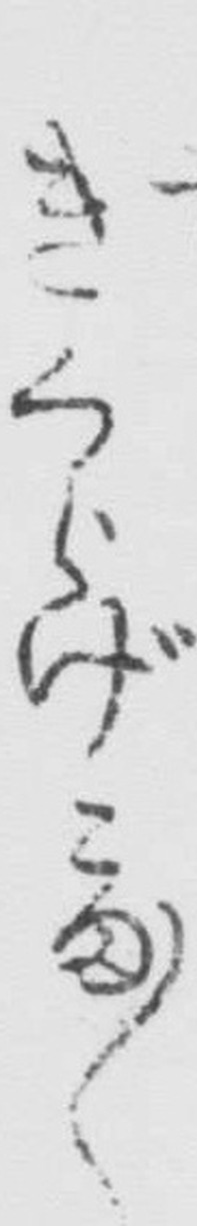きくらげこま〳〵
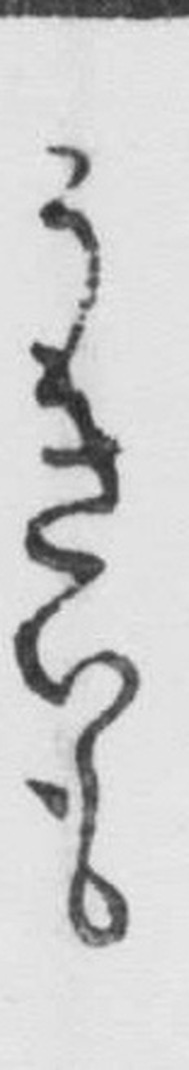うきいも
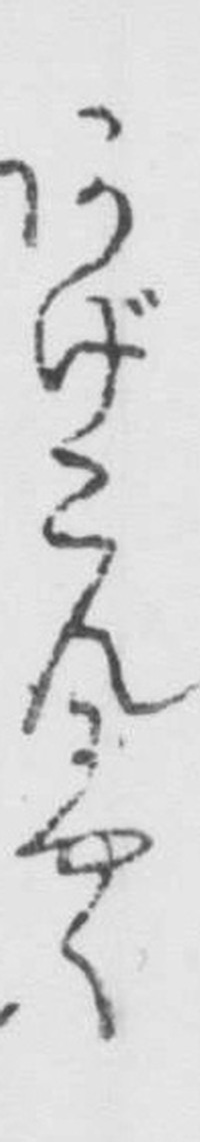あげこんにやく
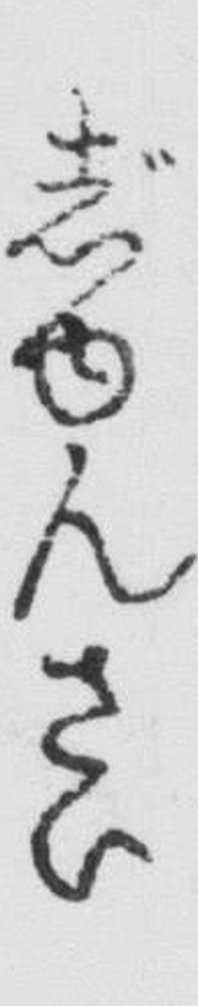じゆんさい
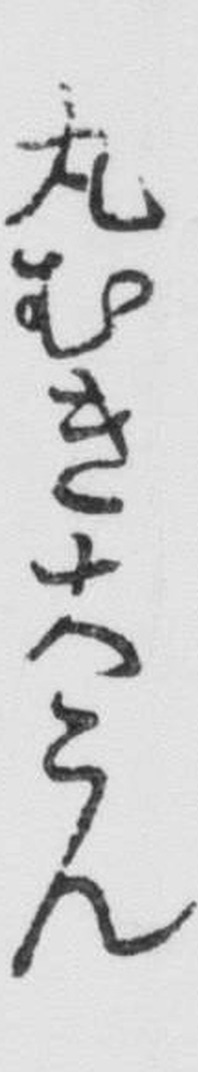丸むき大こん
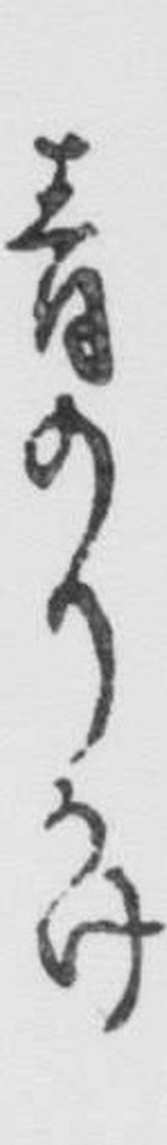青のりかけ
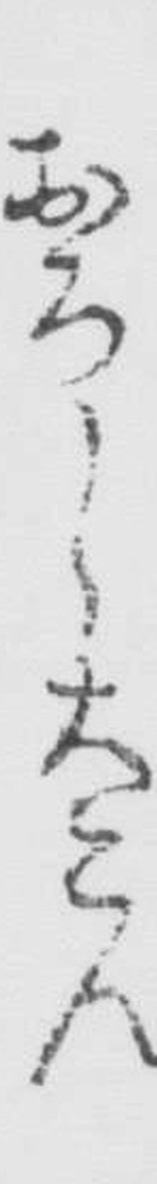おろし大こん
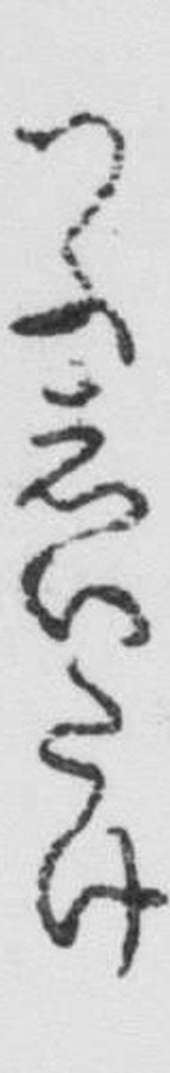つふしいたけ
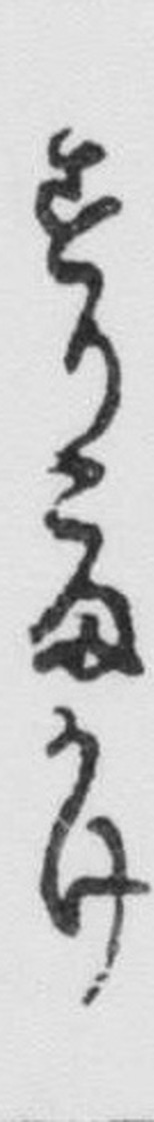すりこまかけ
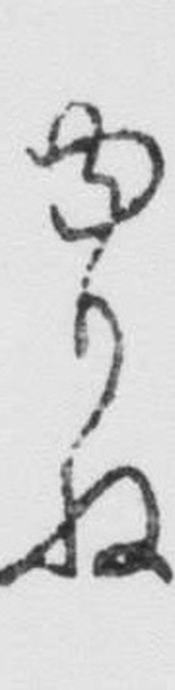ゆりね
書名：諸家通用/即席料理
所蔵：大阪府立大学学術情報センター 国文学研究資料館
